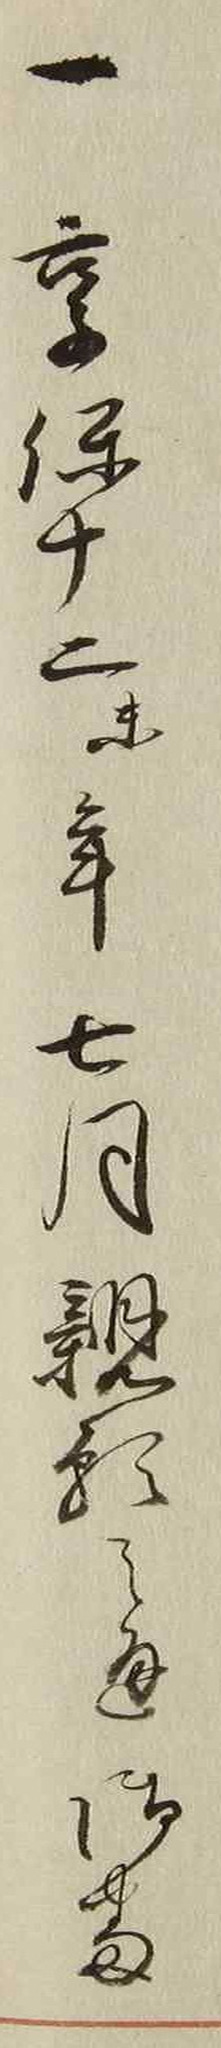一享保十ニ未年七月親願い之通御番代
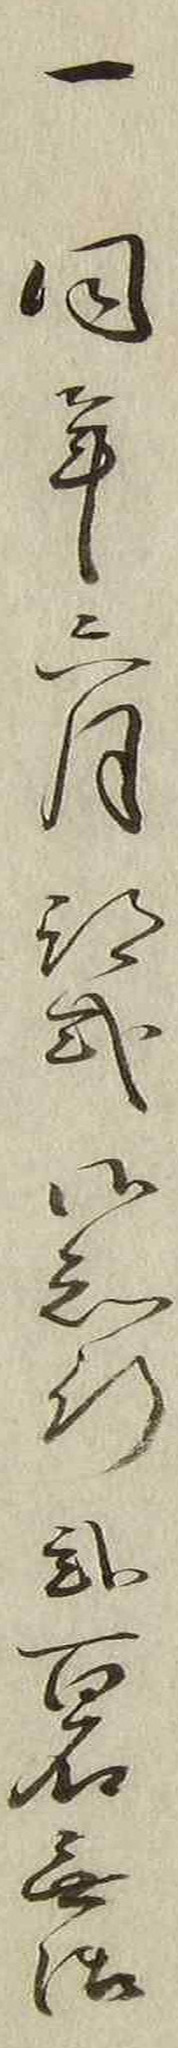一同年六月跡式御知行弐百石御

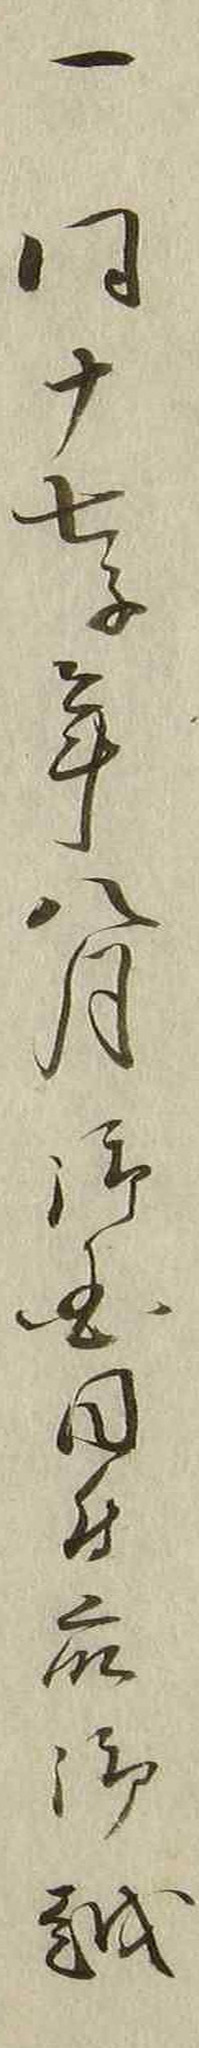一同十七子年八月御国目付衆御越し
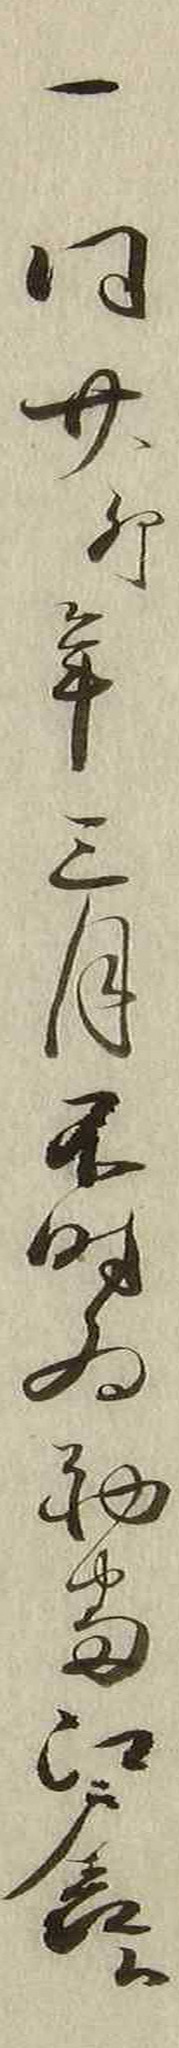一同廿卯年三月不時勤番之為江戸表へ
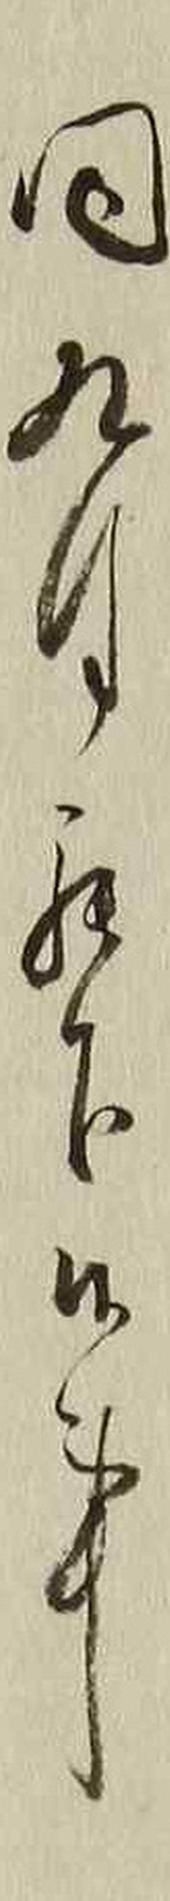同九月罷り下り候事
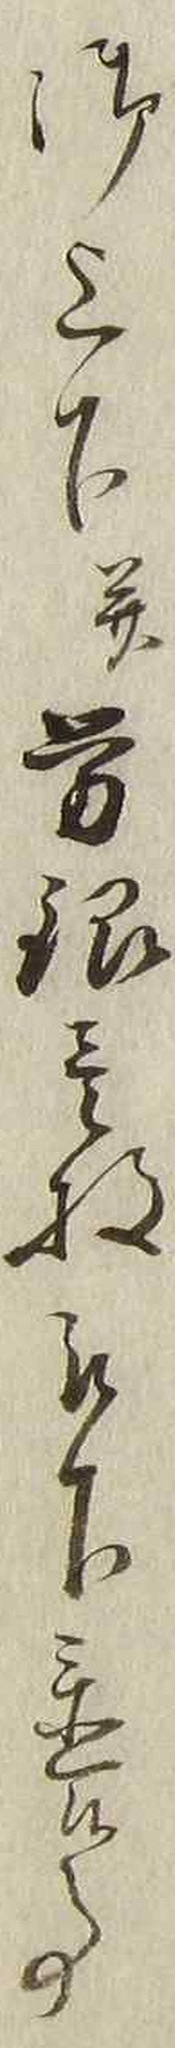御上下幷労銀壱枚下し置かれ候事
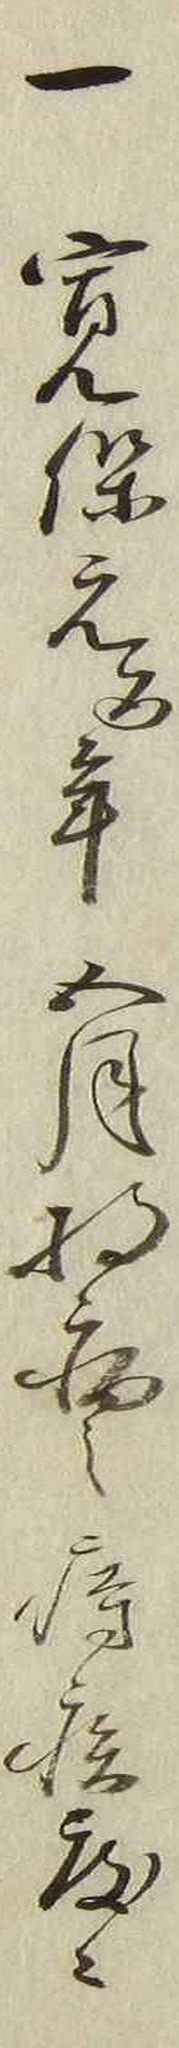一寛保元酉年五月持病之痔疾度々

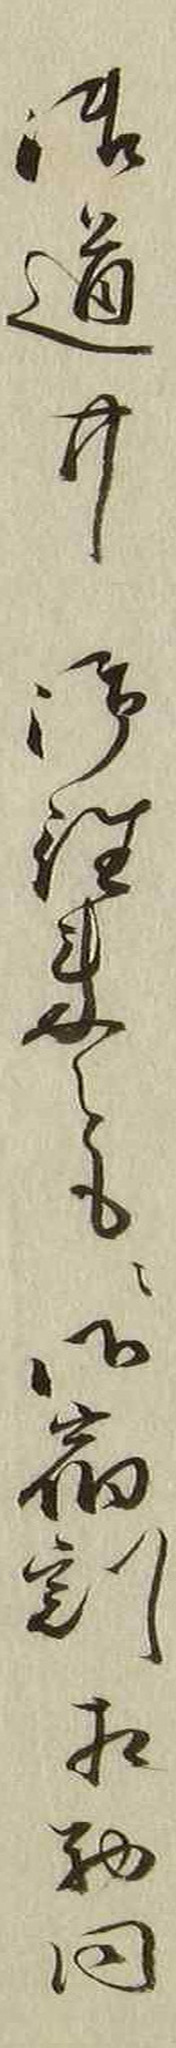御道中御往来ともニ御宿割相勤め同
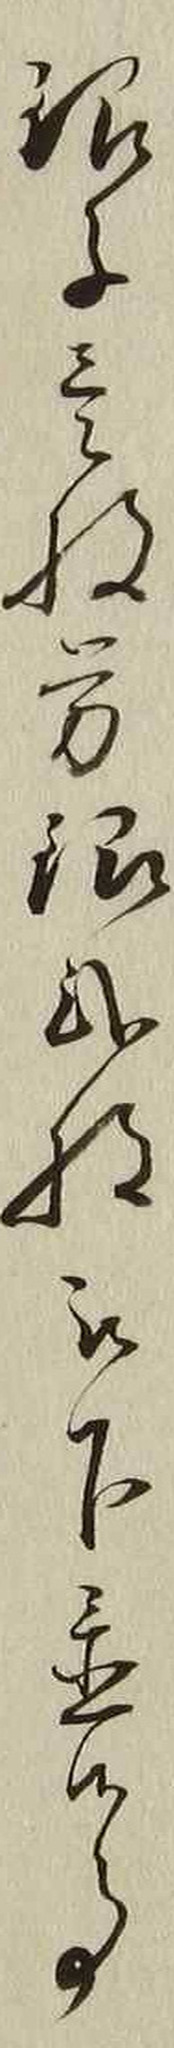銀子壱枚労銀弐枚下し置かれ候事
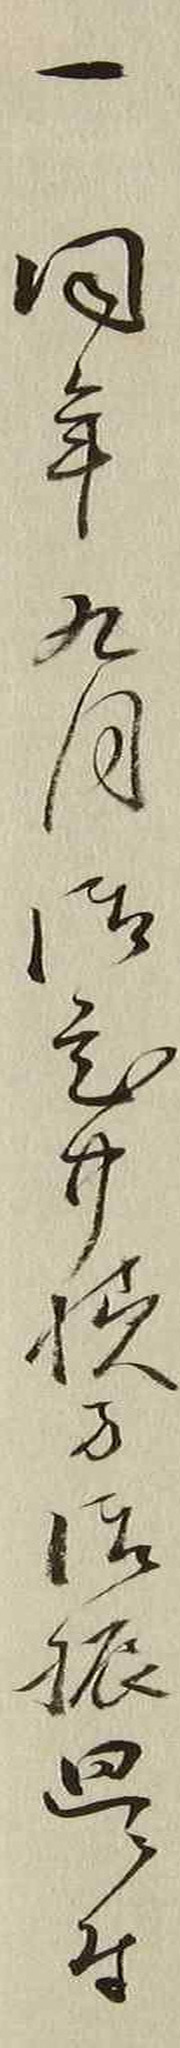一同年九月御老中様方御振廻ニ付き
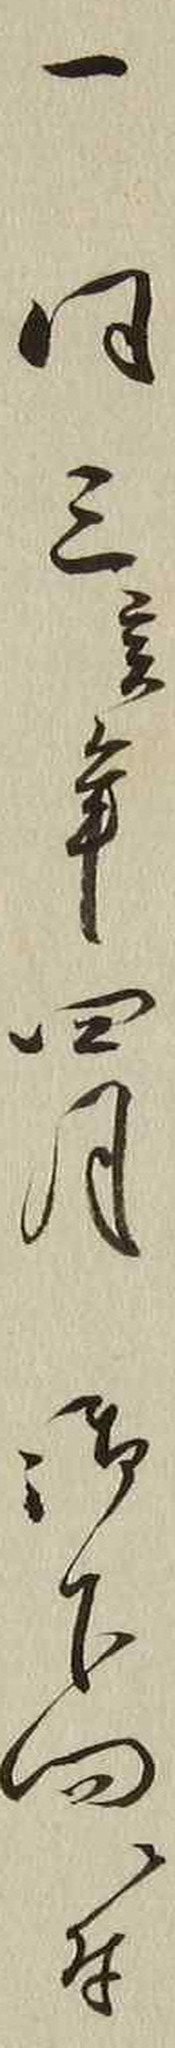一同三亥年四月御下向ニ付き
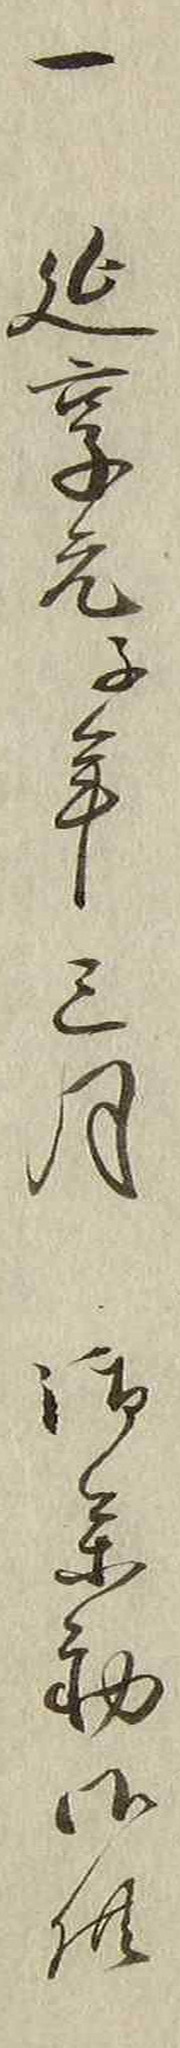一延享元子年三月御参勤御供

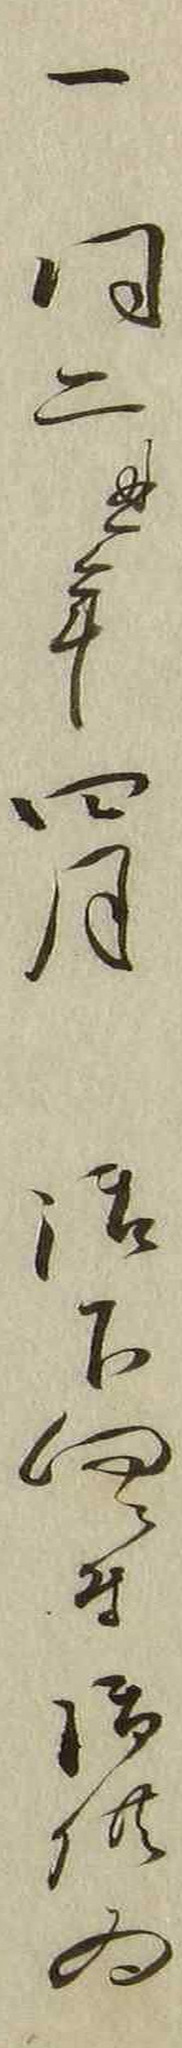一同二丑年四月御下向ニ付き御供
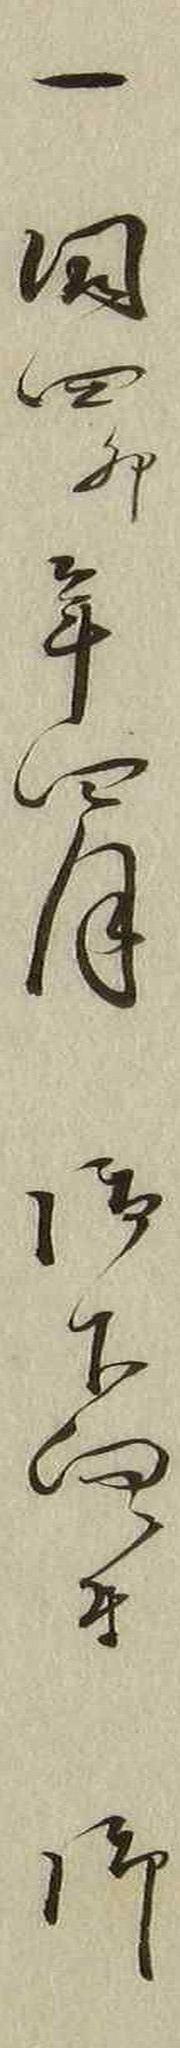一同四卯年四月御下向ニ付き御
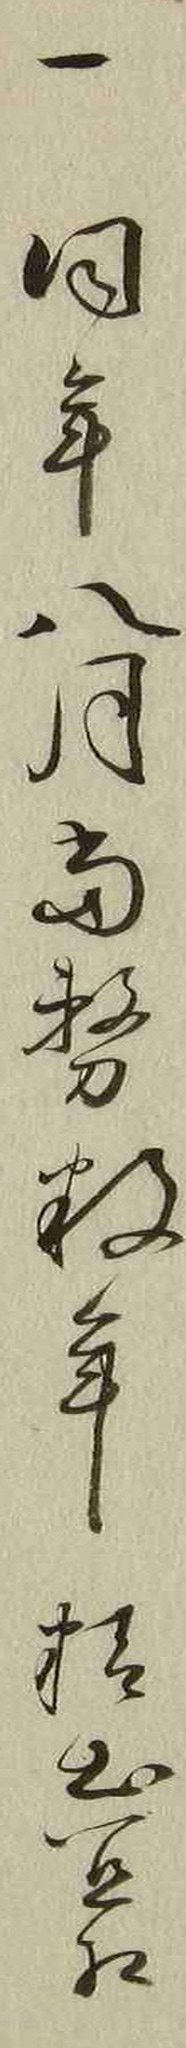一同年八月当務数年精出宜しく相
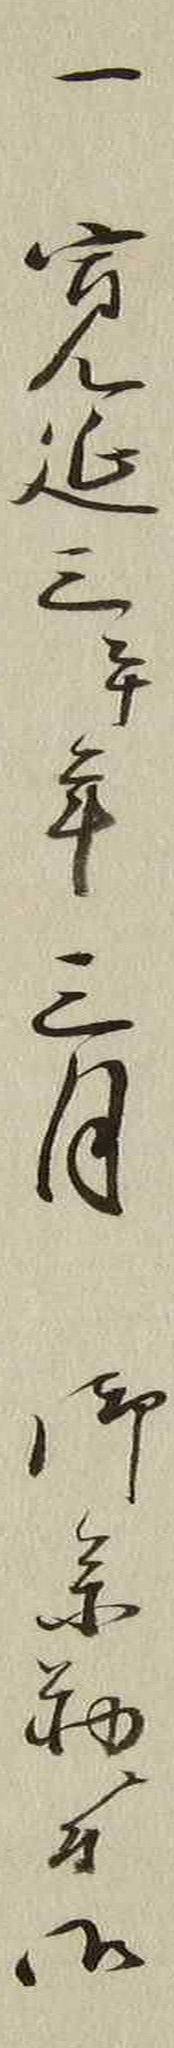一寛延三午年三月御参勤ニ付き御
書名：諸士系譜　巻之20　い之部20
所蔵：会津若松市立会津図書館
